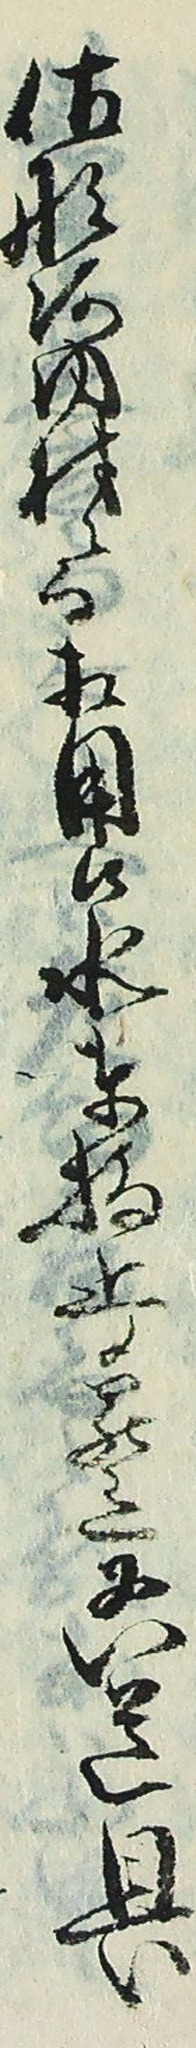佐那河内村に而相用候水車指止め罷在右道具
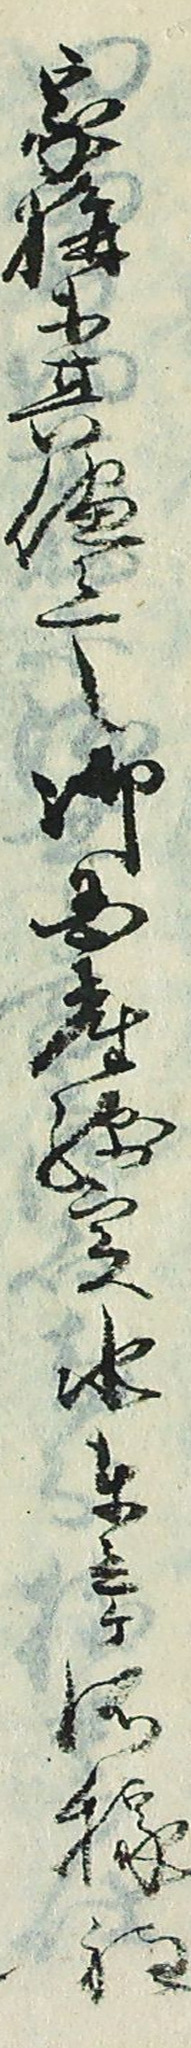家構等其侭有之御国産綿実水車壱ケ所稼程
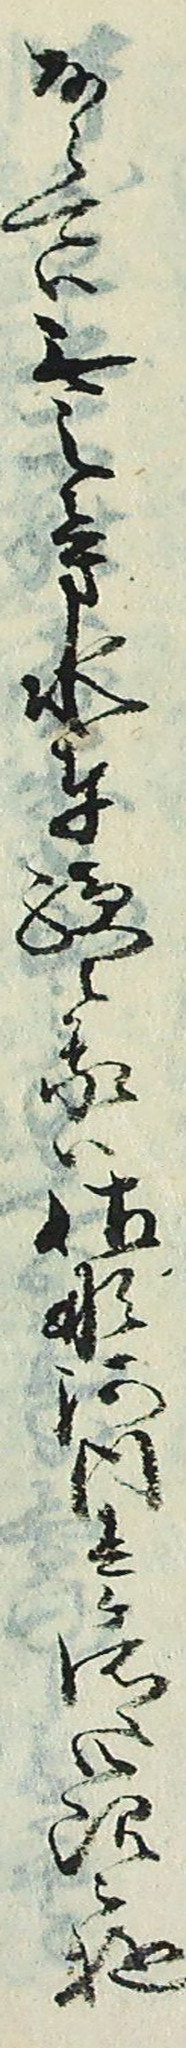ならては無之旁水車絞之義は佐那河内壱ケ所に御限被遊
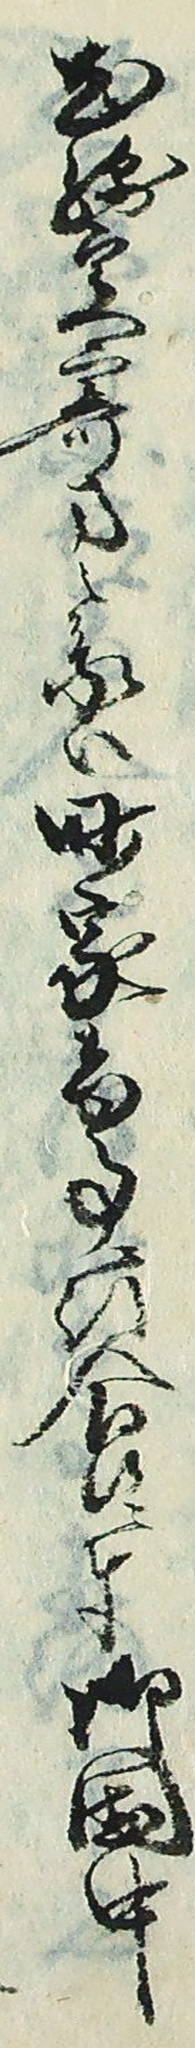尤綿実寄方之義は町家商事に引合候に付御国中
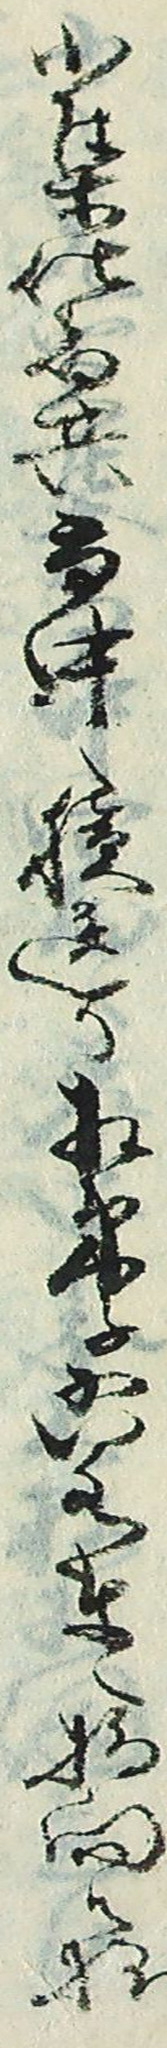小集仕者共市中へ積送り相束ね右水車へ指向候様
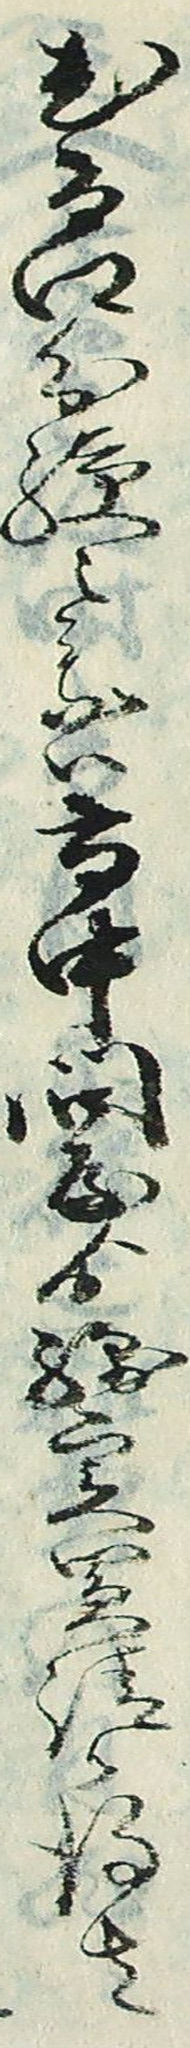尤市郷分絞之義は市中問屋ゟ綿実買請候得共者
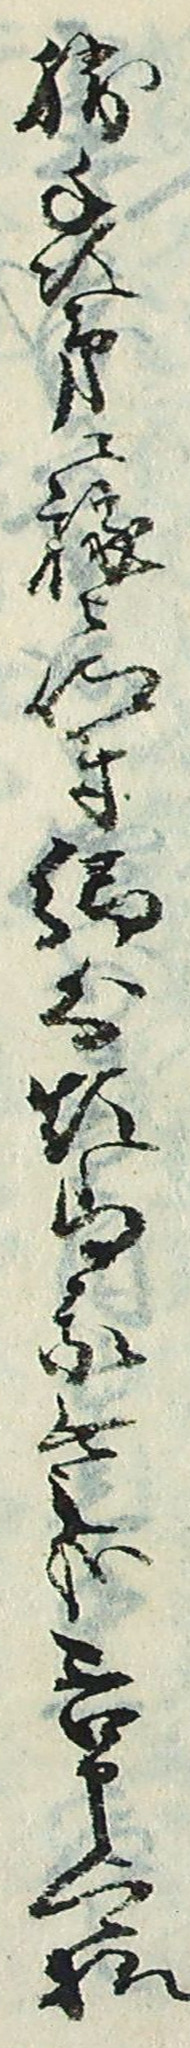勝手次第に稼被仰付郷分煩布義無之哉否申上候様
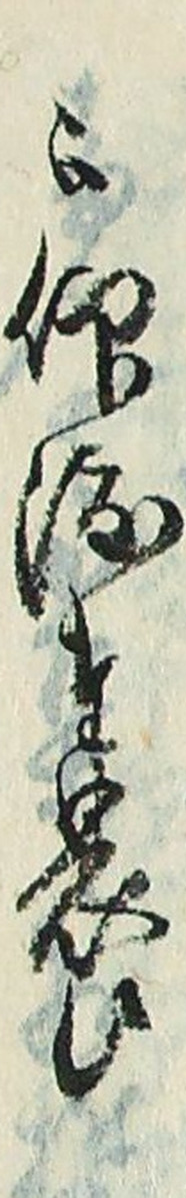被仰渡奉畏候

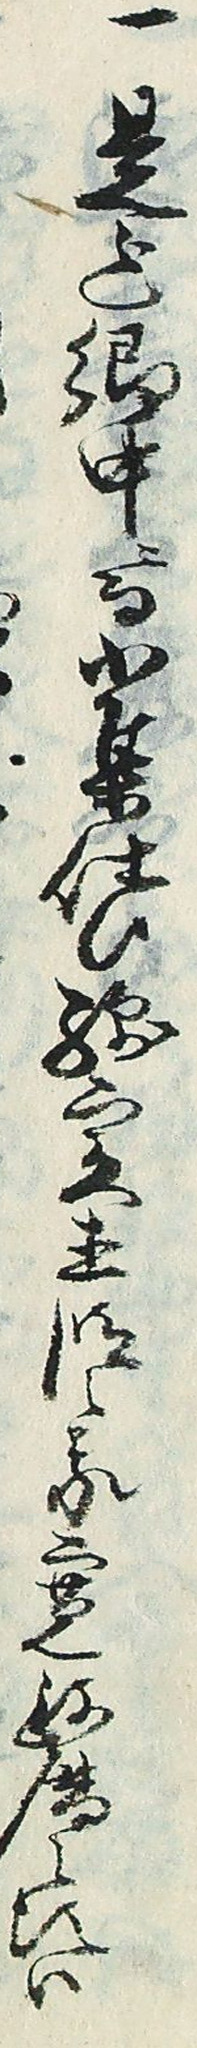是迄郷中に而小集仕候綿実直段之義寬政暦之頃は
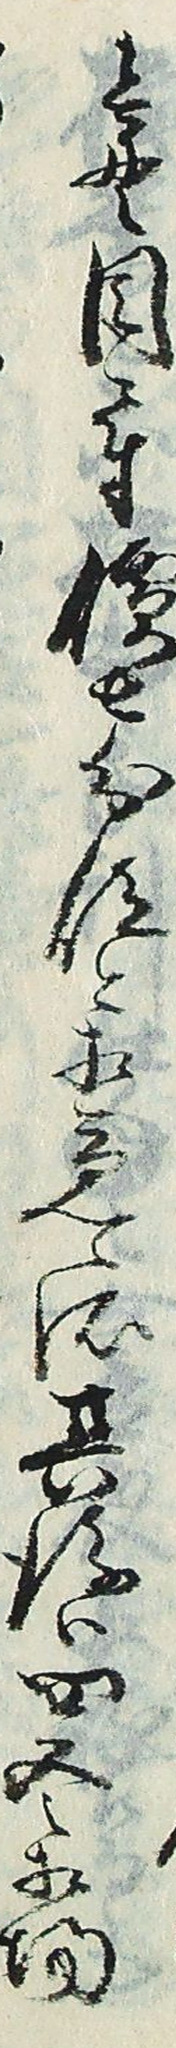壱貫目に付価七分位と相覚候所其後は四五之相場
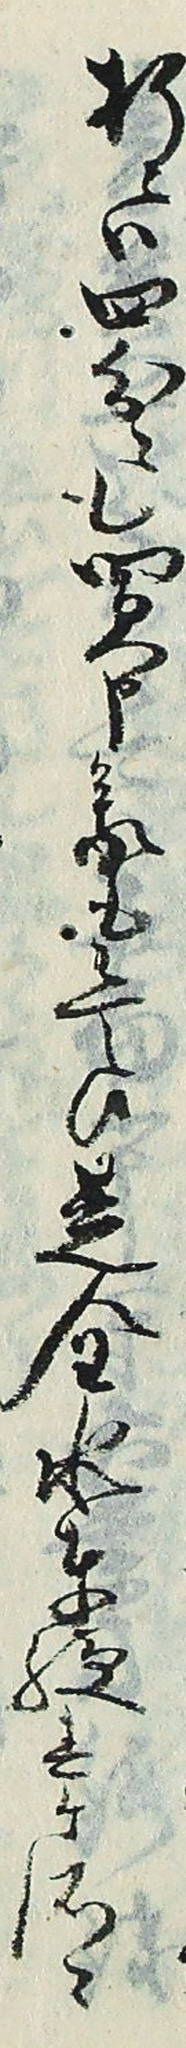折には四分にも買申義も有之候是全水車絞壱ケ所に
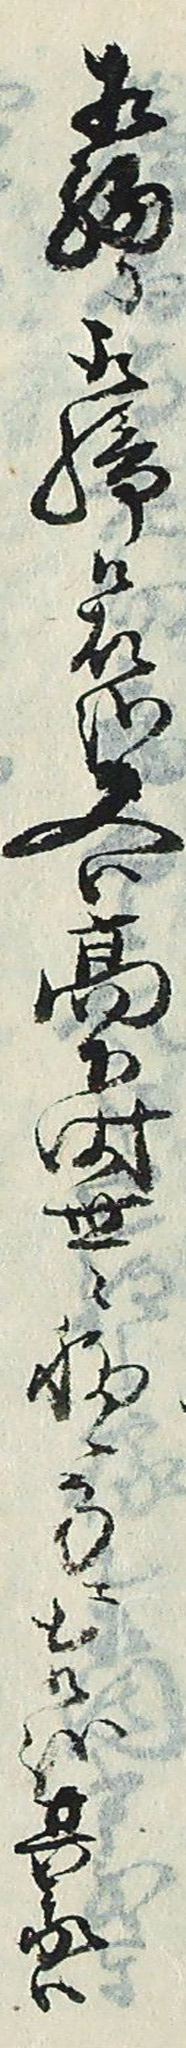相約り取締候故哉又は高下時世に移候方にも候哉其義は
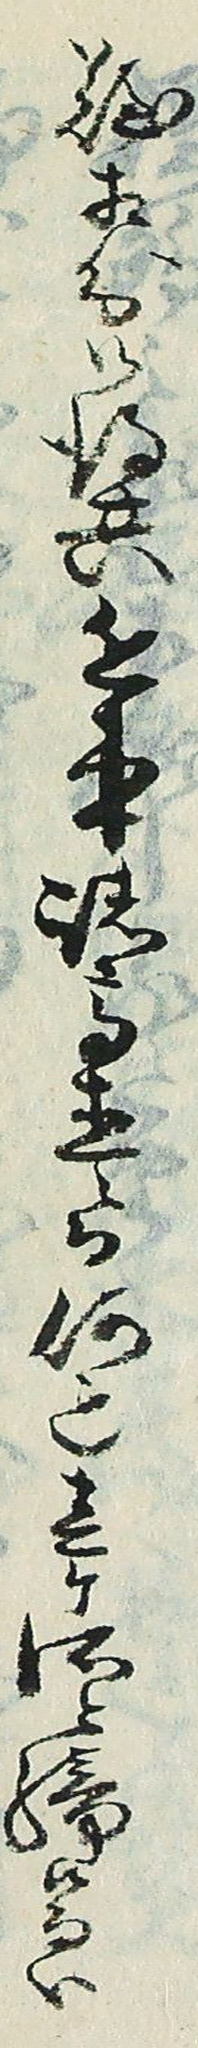難相分候得共近来諸高直に而何連壱ケ所に締候而は
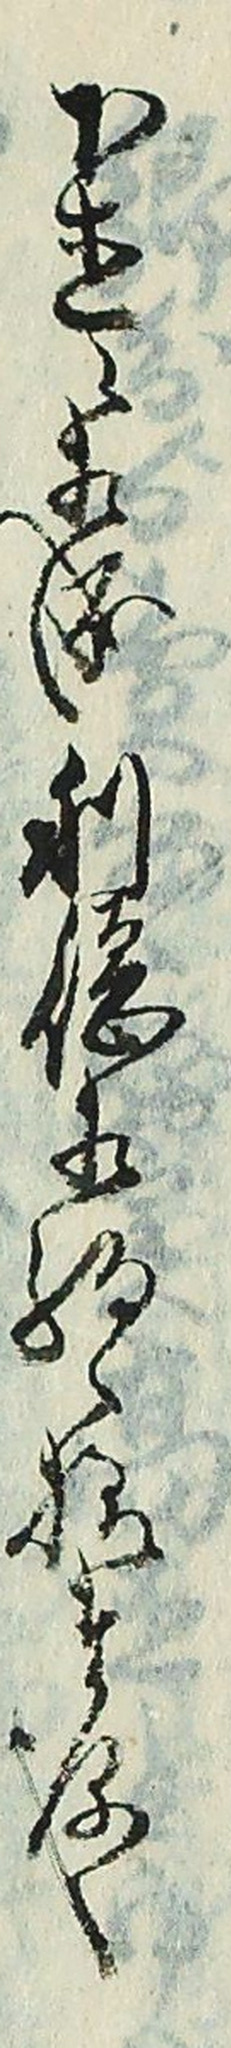下直に相成利得相約候様奉存候
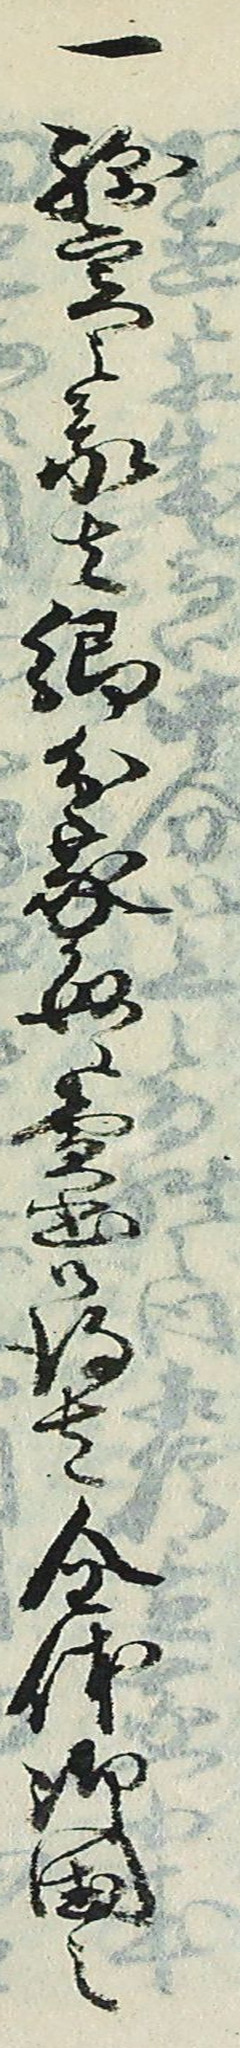一綿実之義者郷分家毎に売出候得者全体御国之
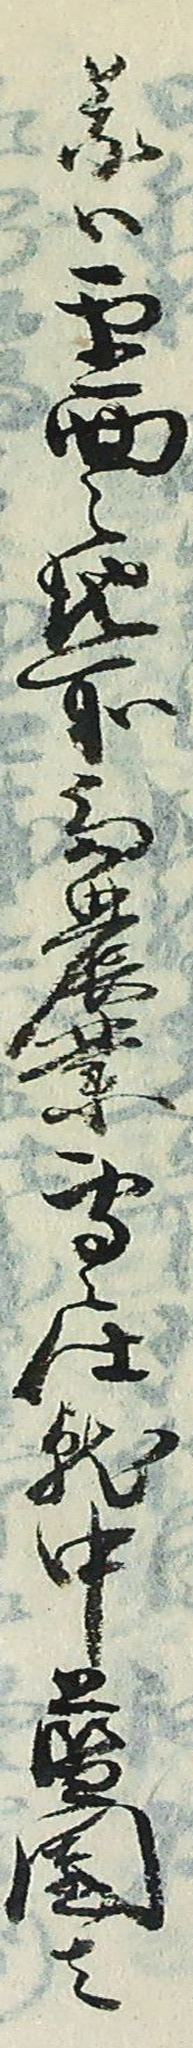義は平面之地所多農業専に仕就中藍園者
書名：油稼御取究ニ附御箇條書テ以被仰渡南北同役申談御答書控
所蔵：鳴門教育大学 Naruto University of Education
